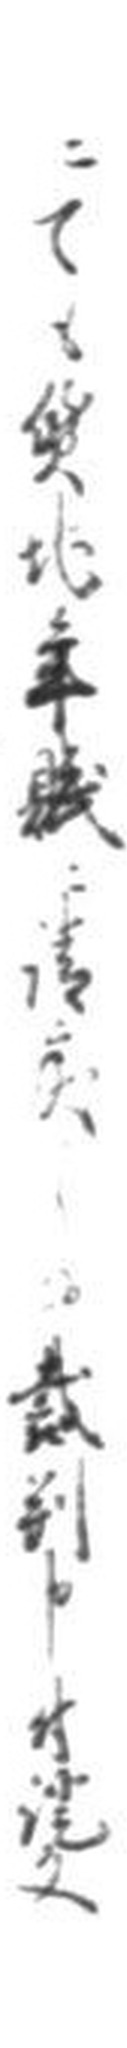ニても質地年賦ニ請戻し候裁判申付証文
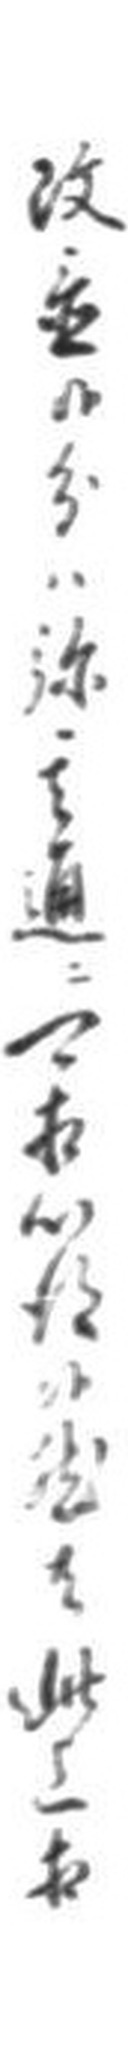致置候分ハ弥其通ニ可相心得候然共此上相
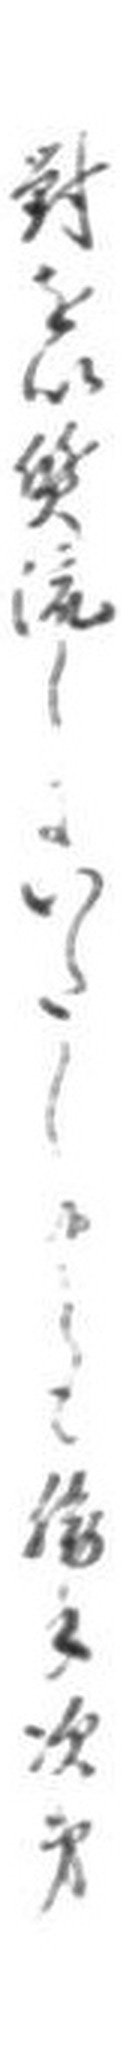対を以質流しにいたし候とも勝手次第
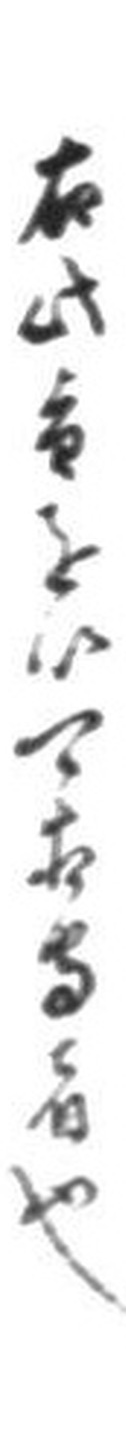右此旨を以可相守者也
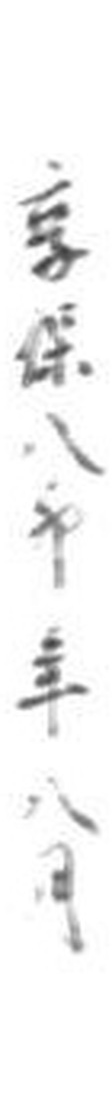享保八卯年八月
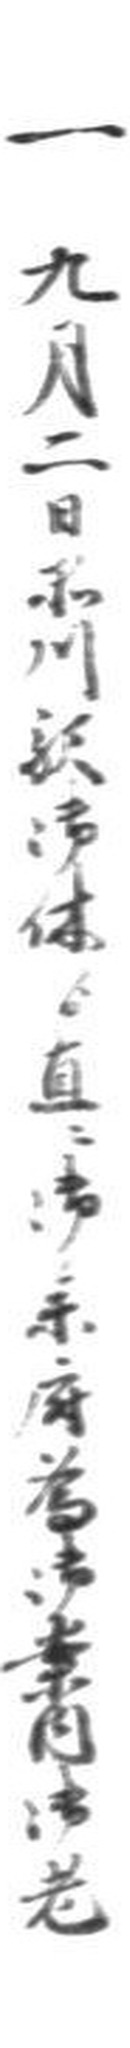一九月二日品川駅御休ゟ直ニ御参府為御案内御老
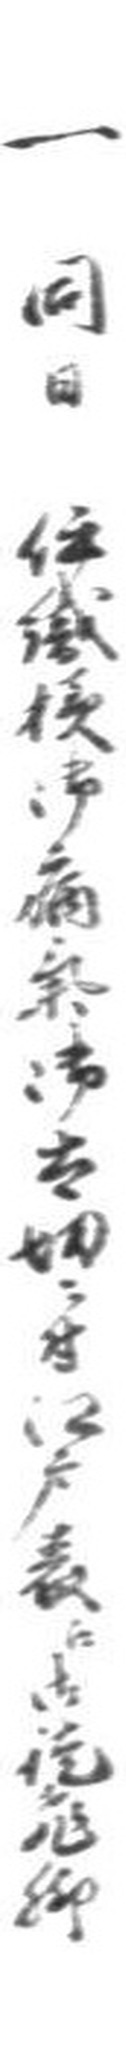一同日伊織様御病気御太切ニ付江戸表江御徒飛脚
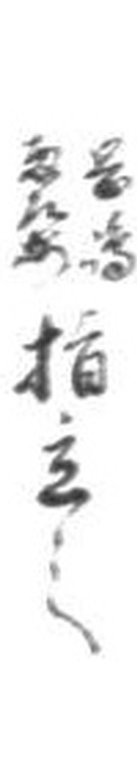惣左衛門指立之

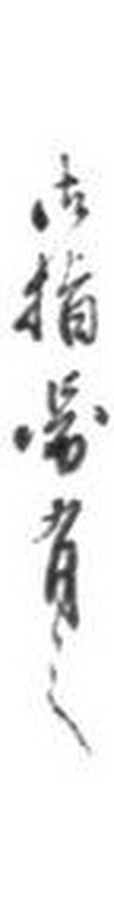御指図有之
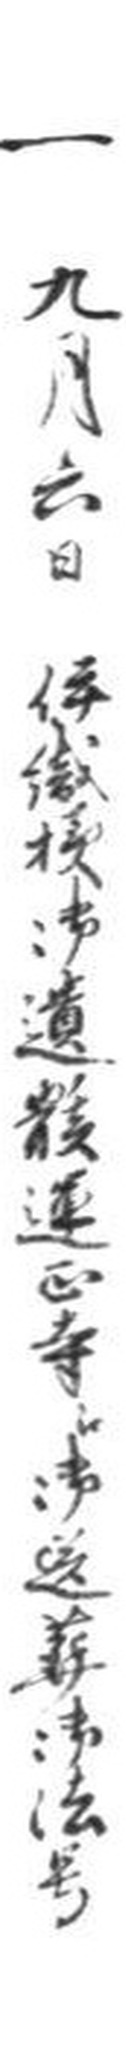一九月六日伊織様御遺骸運正寺江御送葬御法号
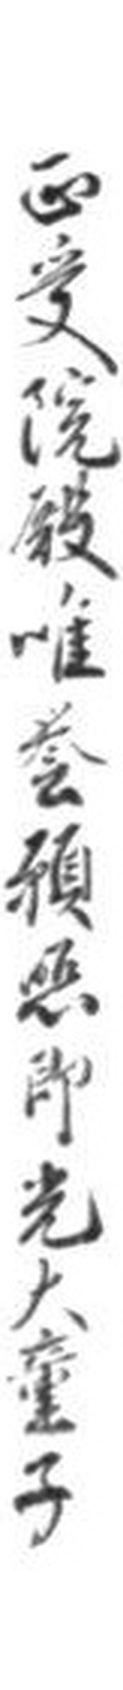正受院殿唯誉願照即光大童子
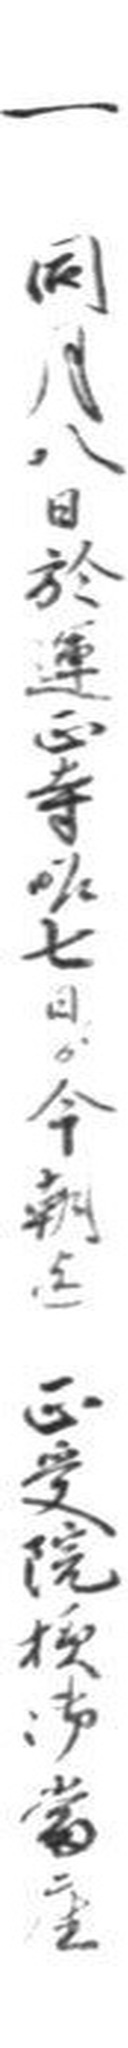一同月八日於運正寺昨七日ゟ今朝迄正受院様御当座
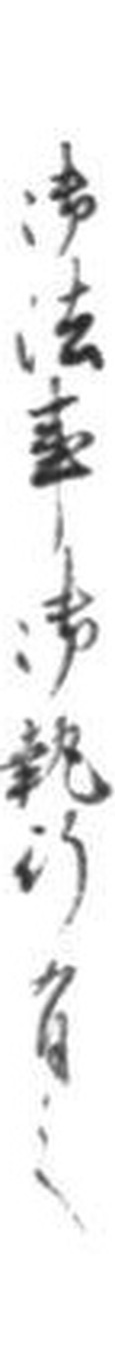御法事御執行有之
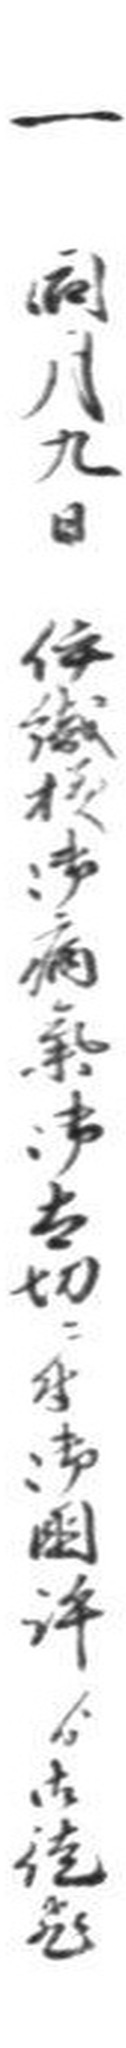一同月九日伊織様御病気御太切ニ付御国許ゟ御徒飛
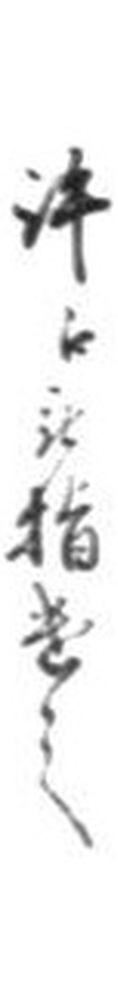許江被指遣之
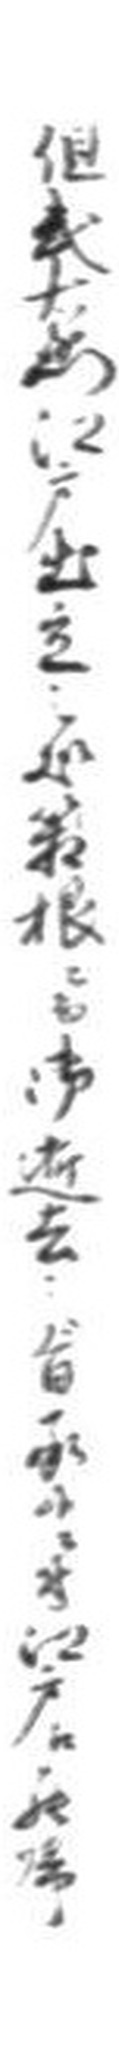但武右衛門江戸出立之処箱根ニ而御逝去之旨承候ニ付江戸江罷帰候
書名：家譜 三十六 宗昌公 従享保八年到同九年
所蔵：福井県文書館 Fukui Prefectural Archives
